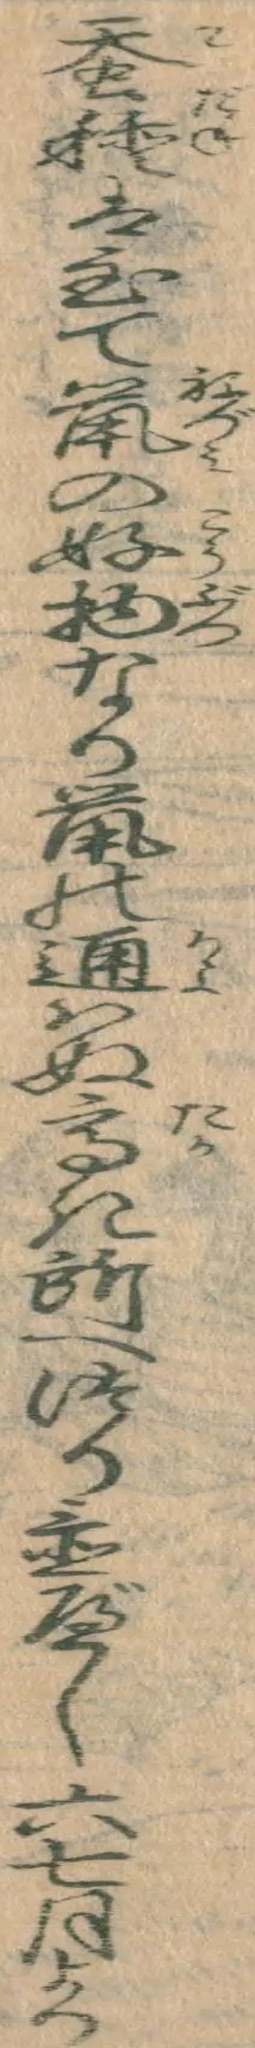蚕種は至て鼠の好物なり鼠の通はぬ高き所へつり置べし六七月より
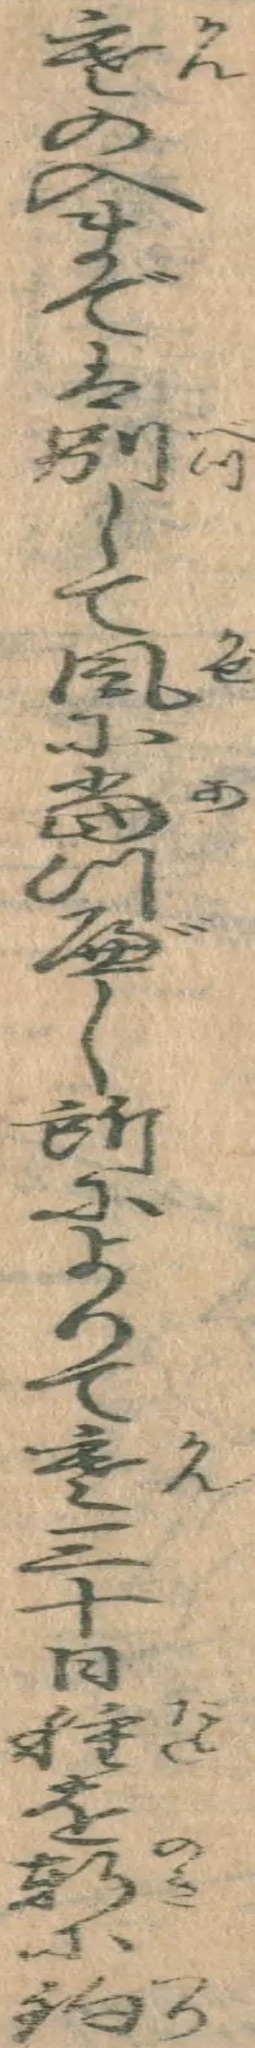寒の入までは別して風に当つべし所によりて寒三十日種を軒に釣
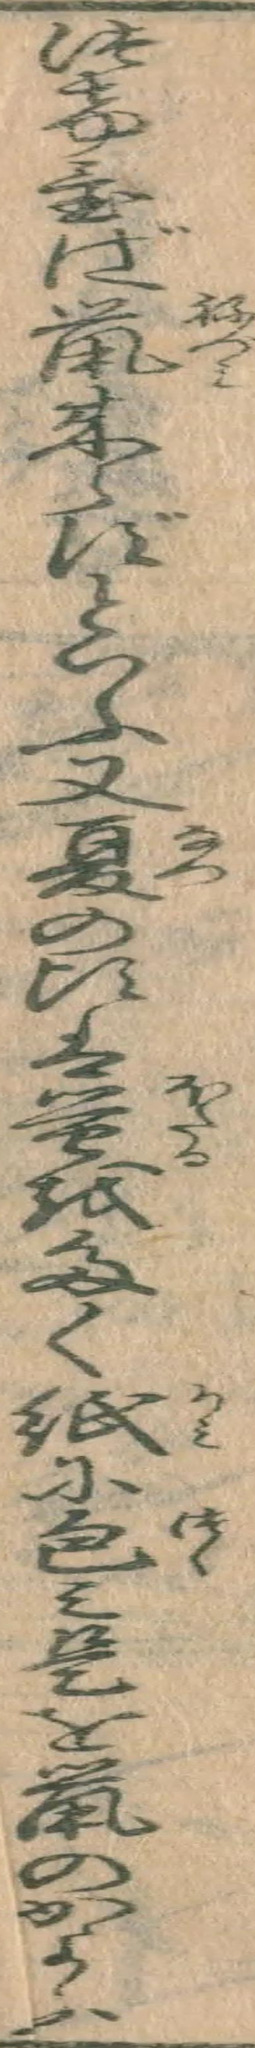つけ置ば鼠来らずといふ又夏の頃は蛍を多く紙に包み是を鼠のかよふ
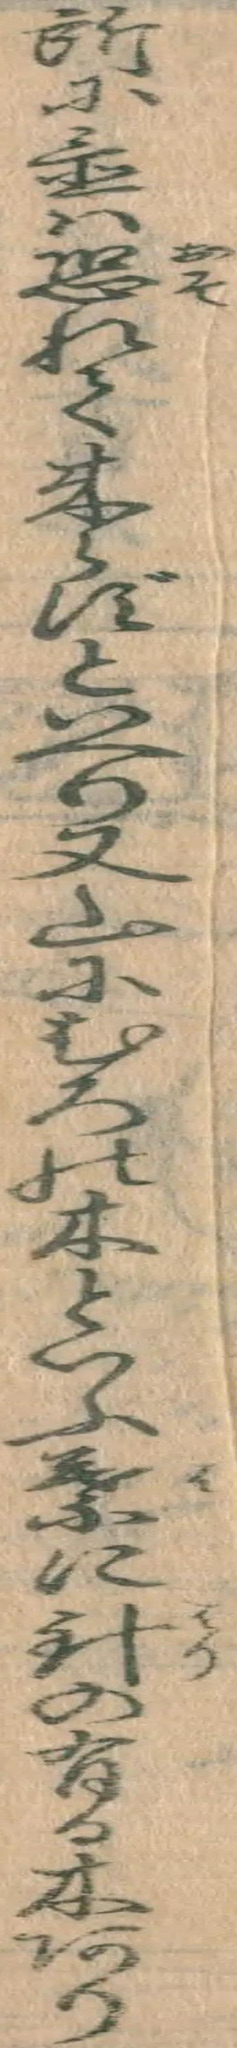所に置は恐れて来らずといへり又山にむろの木といふ葉に針の有る木あり
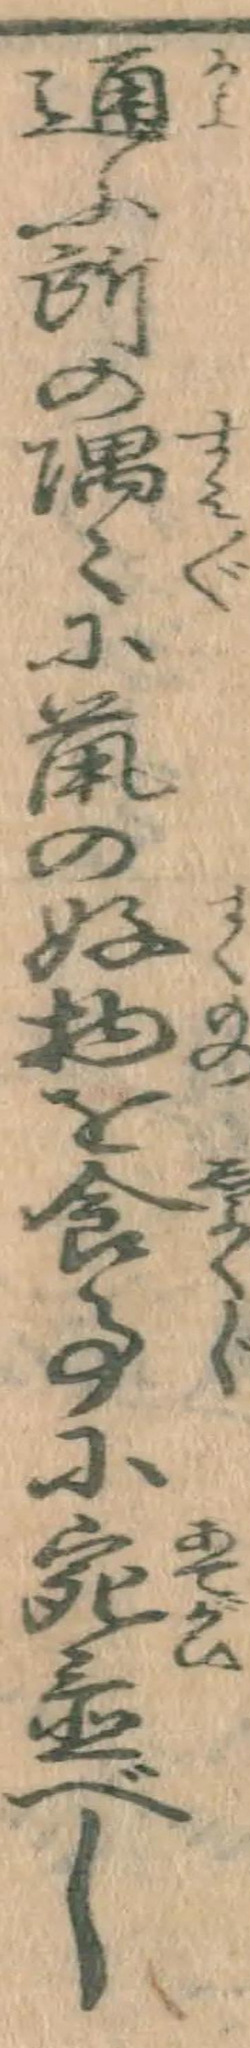通ふ所の隅々に鼠の好物を食事に宛置べし
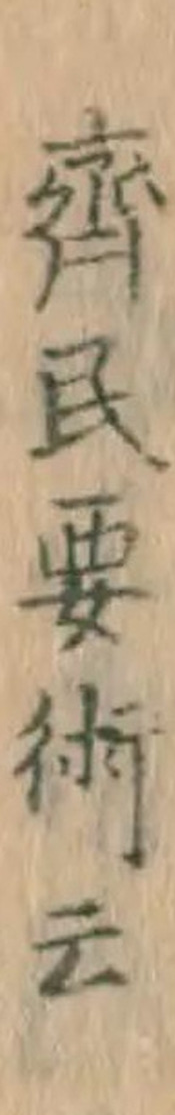斉民要術云
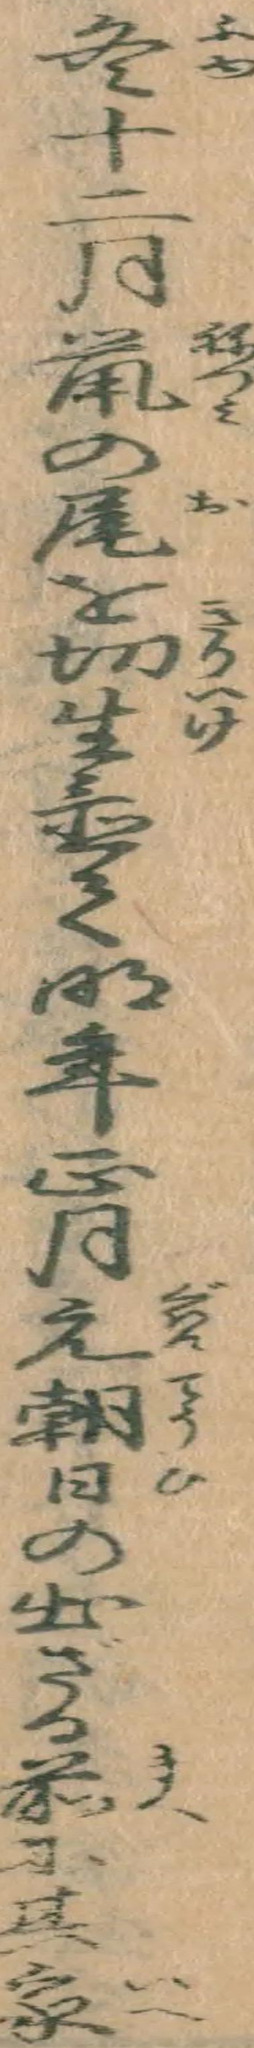冬十二月鼠の尾を切生置て明年正月元朝日の出ざる前に其家
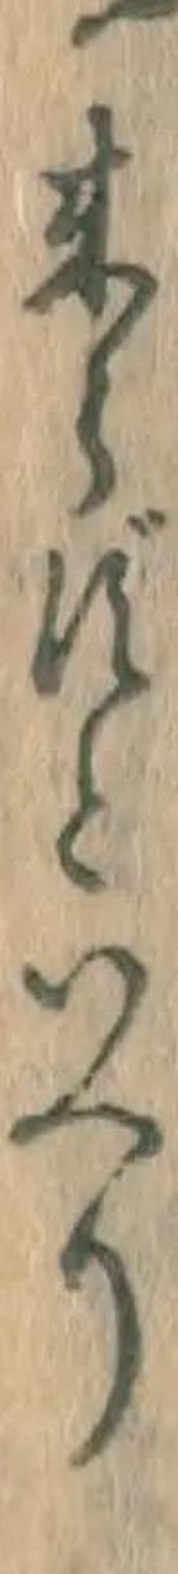来らずといへり
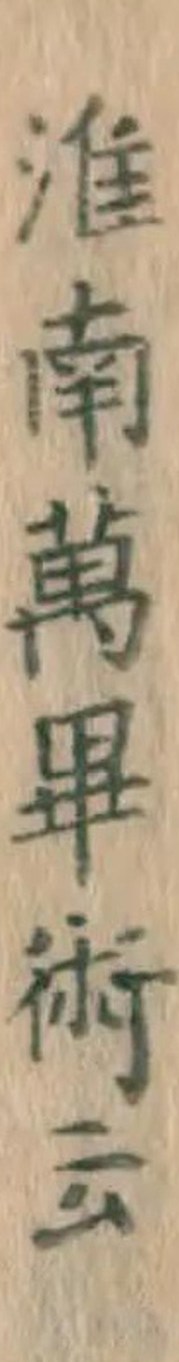准南万畢術云
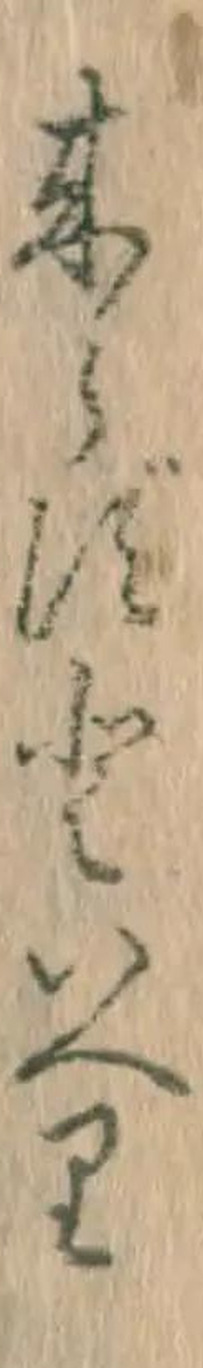来らずといへり
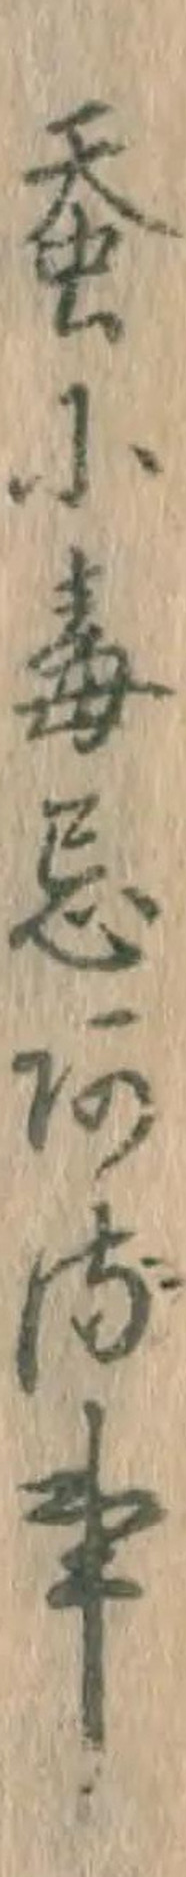蚕に毒忌ある事
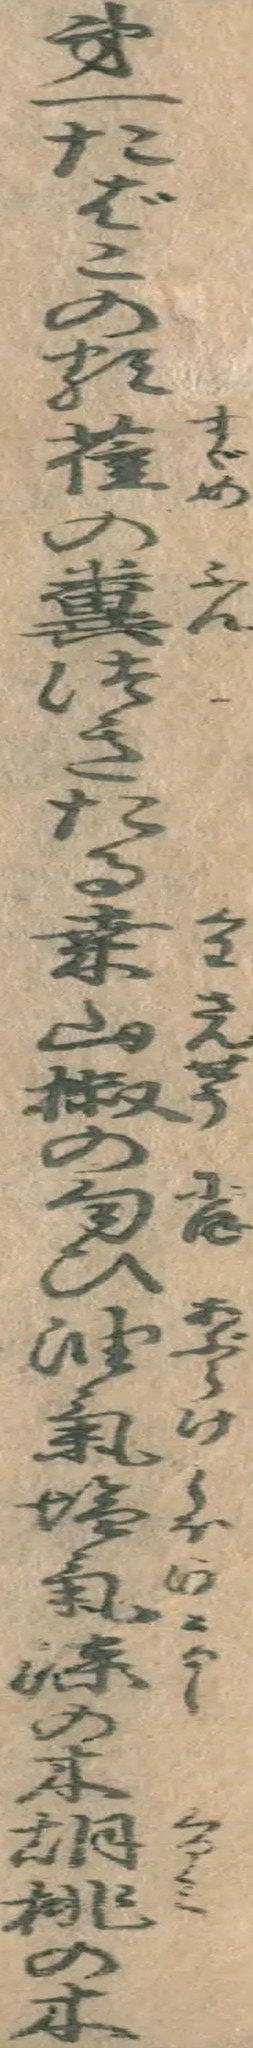第一たばこの類雀の糞つきたる桑山椒の匂ひ油気塩気漆の木胡桃の木
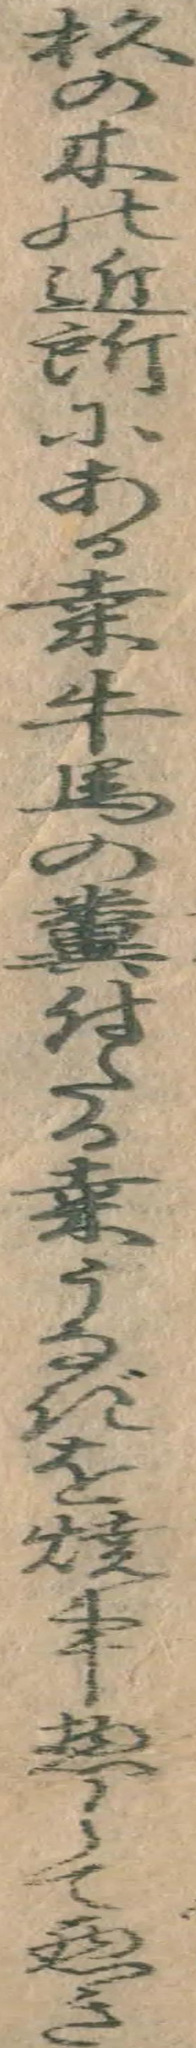杉の木の近所にある桑牛馬の糞付たる桑うなぎを焼事惣して悪き
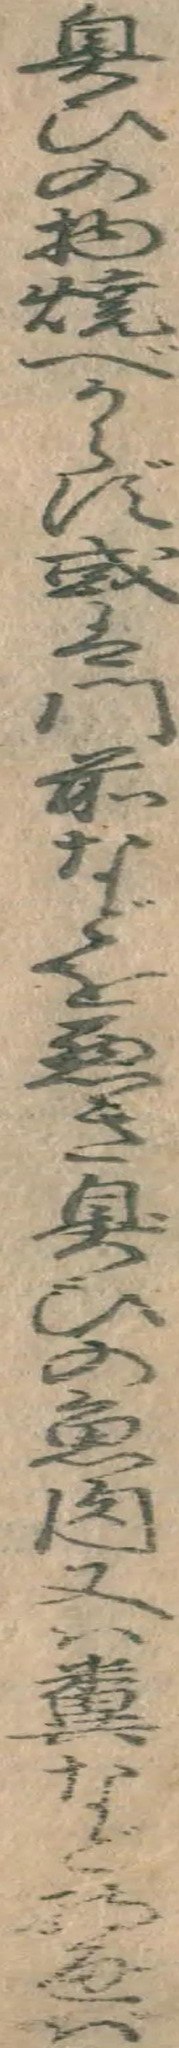臭ひの物焼べからず或は門前などを悪き臭ひの魚肉又は糞など持通ば

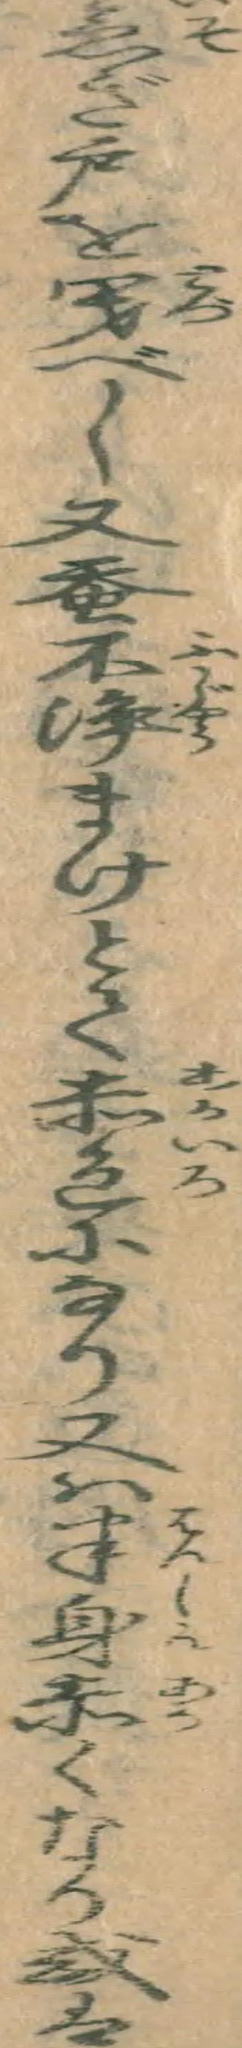急ぎ戸を閉べし又蚕不浄まけとて赤色になり又は半身赤くなり或は
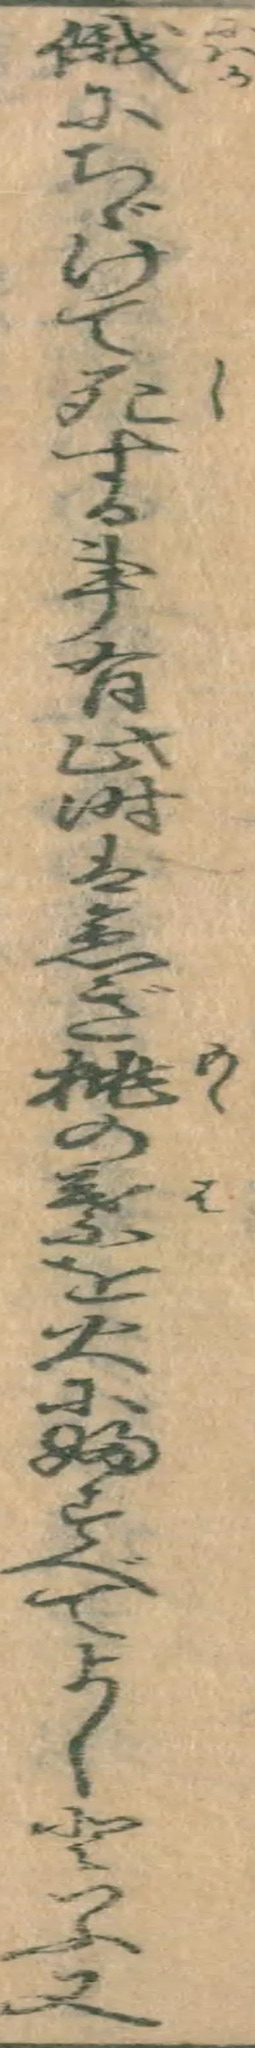俄にちゞけて死する事有此時は急ぎ桃の葉を火にふすべてよしといふ又
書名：養蚕秘録 3巻. [1]
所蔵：国立国会図書館 National Diet Library, JAPAN
